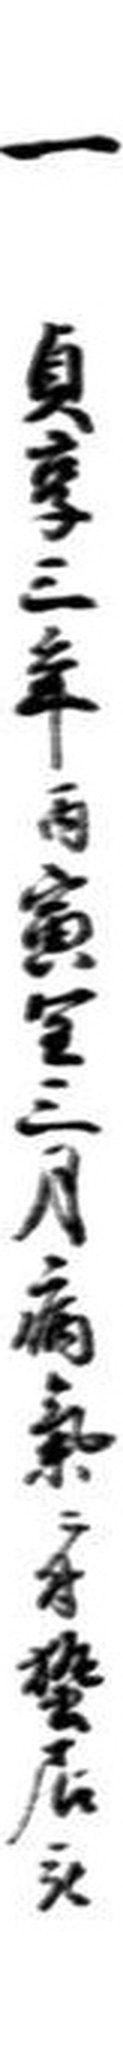一貞享三年丙寅閏三月病気ニ付蟄居被

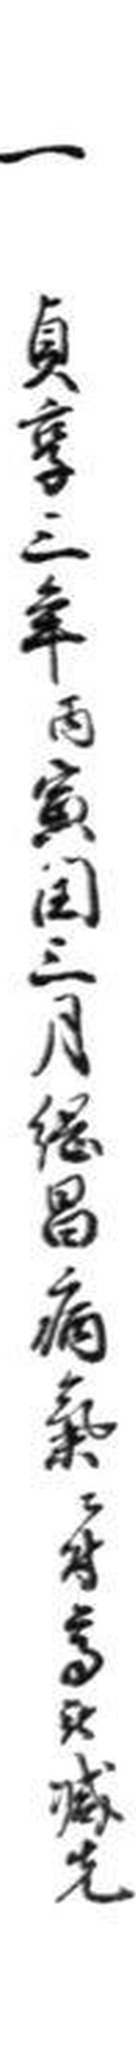一貞享三年丙寅閏三月綱昌病気ニ付高被減先
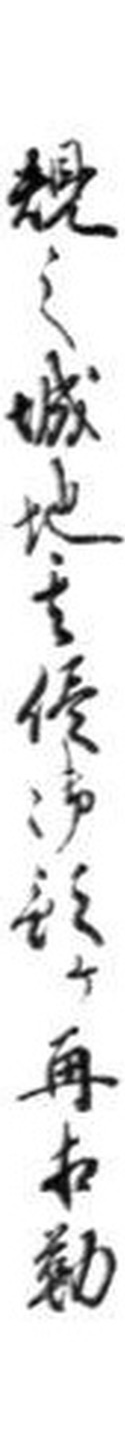規之城地其儘御預ヶ再相勤
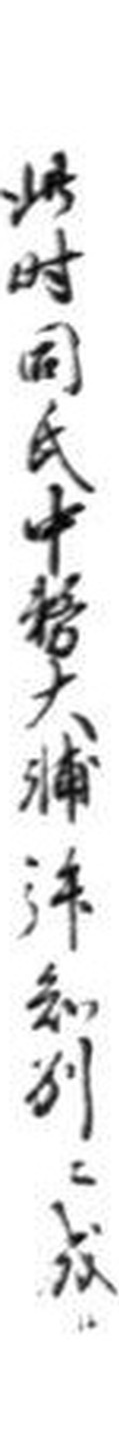此時同氏中務大輔拝知別二成ㇽ
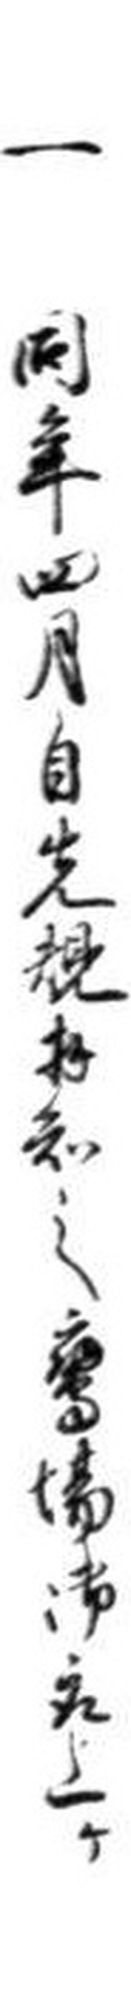一同年四月自先規拝知之鷹場御取上ヶ
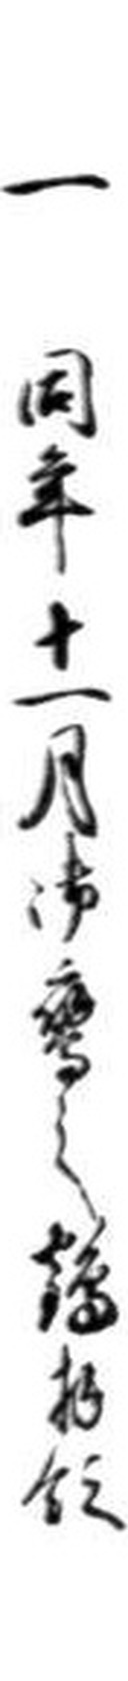一同年十一月御鷹之鶴拝領
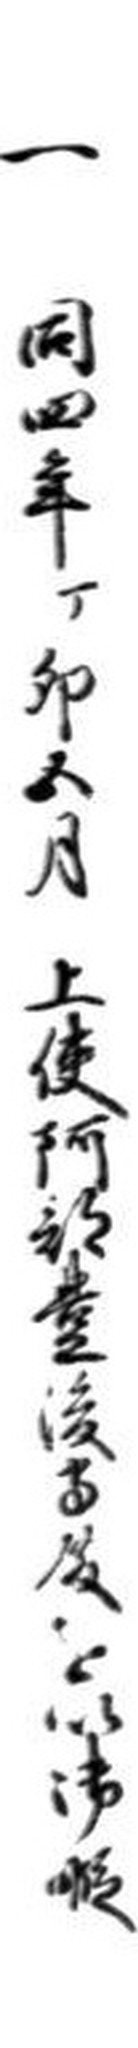一同四年丁卯五月上使阿部豊後守殿を以御暇
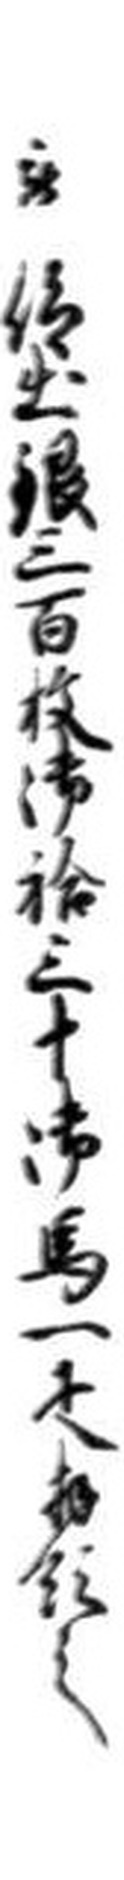被仰出銀三百枚御袷三十御馬一疋拝領之
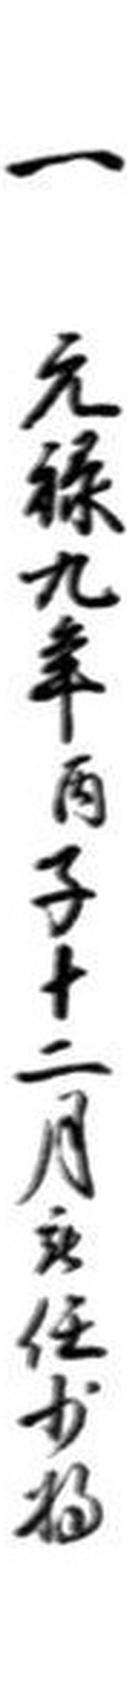一元禄九年丙子十二月被任少将
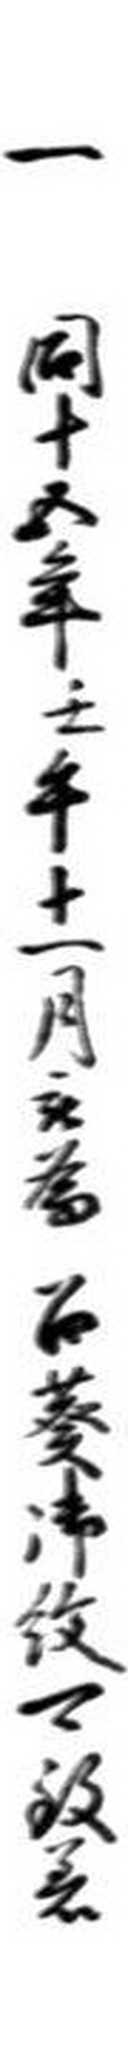一同十五年壬午十一月被為召葵御紋可致着
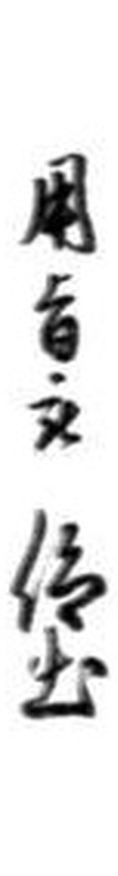用旨被仰出
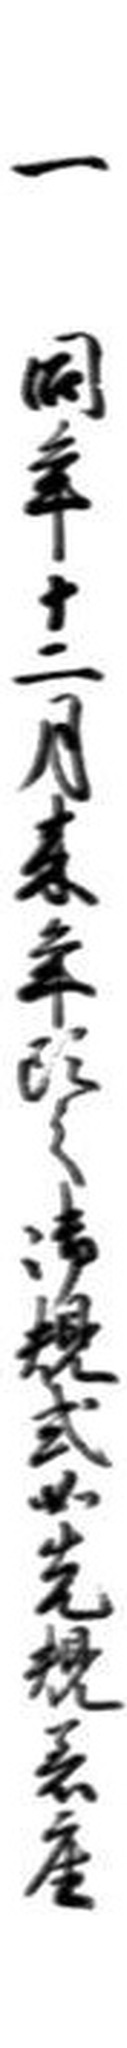一同年十二月来年頭之御規式如先規着座
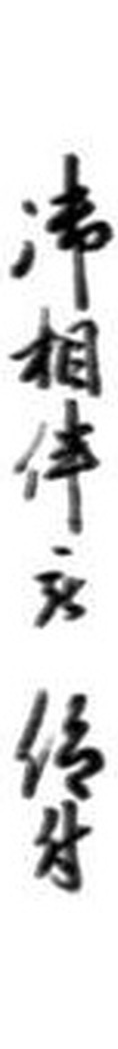御相伴被仰付
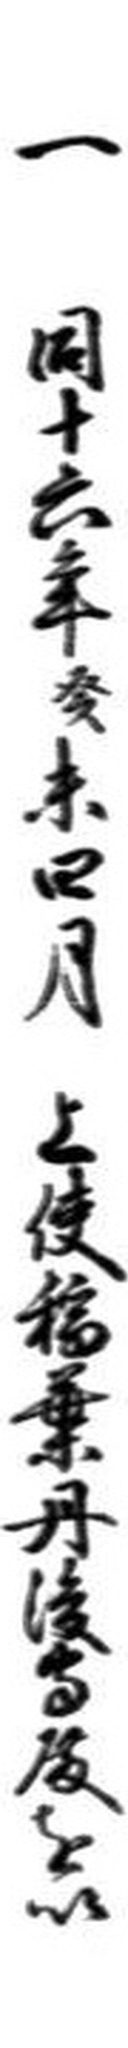一同十六年癸未四月上使稲葉丹後守殿を以
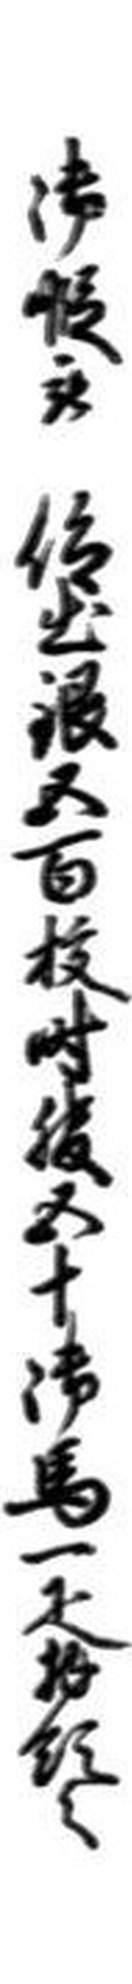御暇被仰出銀五百枚時服五十御馬一疋拝領之
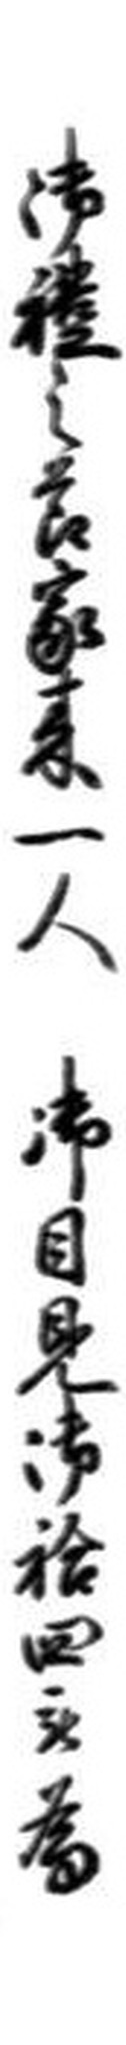御礼之節家来一人御目見御袷四被為
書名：家譜 三十一 吉邦公 享保元年
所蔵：福井県文書館 Fukui Prefectural Archives
